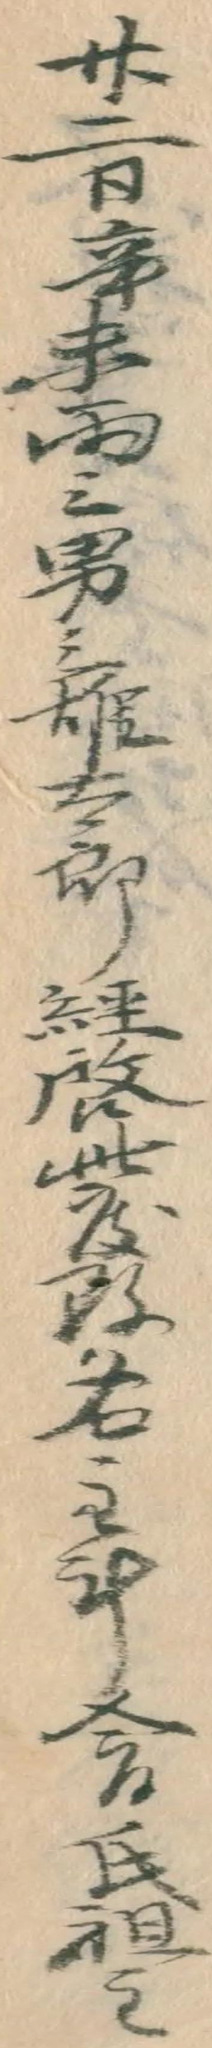廿二日辛未両三男三雄太郎経啓此度改名主計今日氏祖主

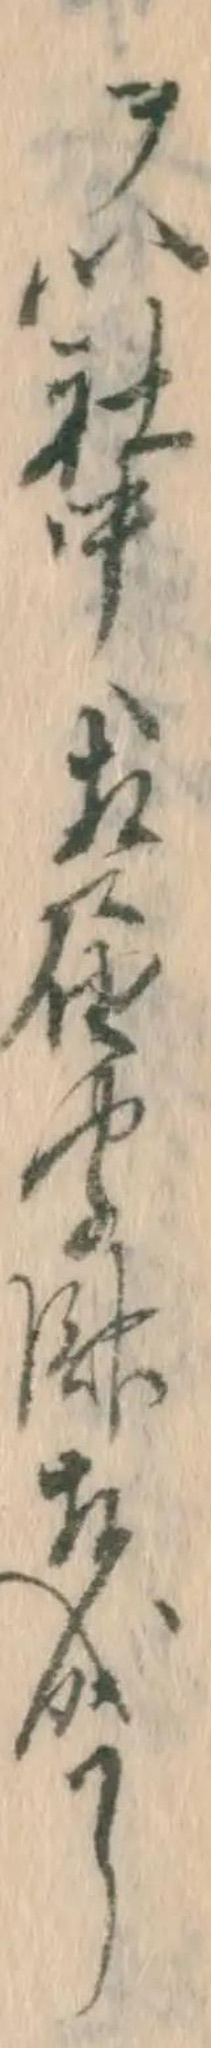ヲ以社中へ相届聞済相成了
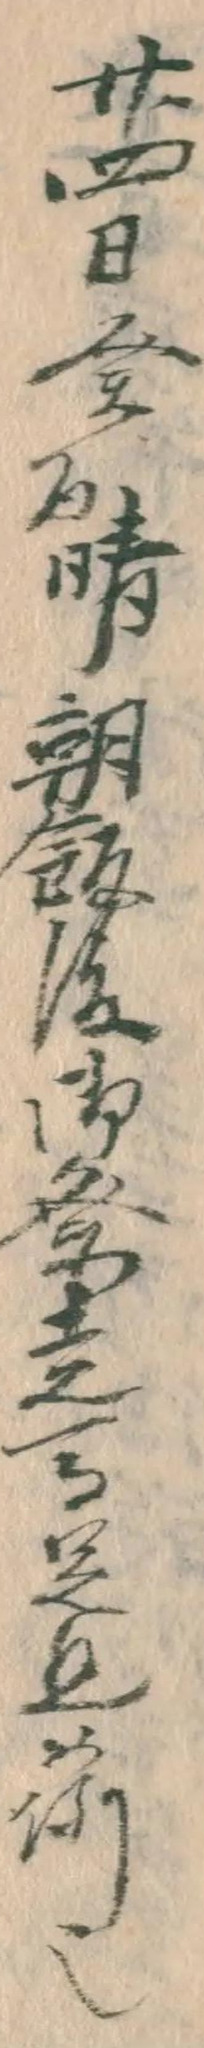廿四日癸酉晴朝飯後御祭走馬足見如例也
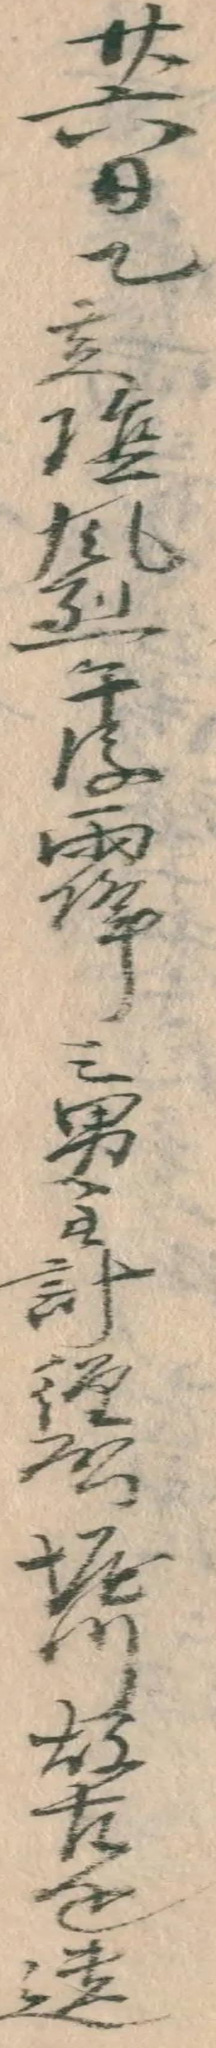廿六日乙亥陰風烈午後雨降三男主計経啓堀川故左近遺
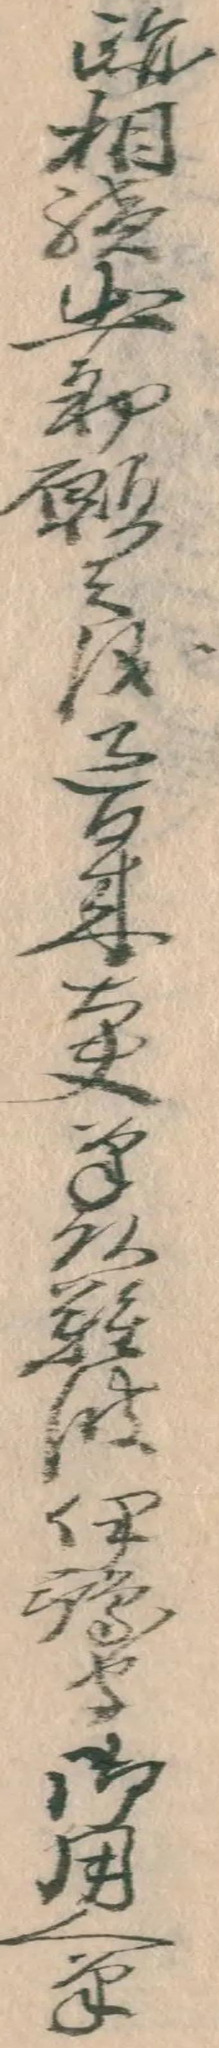跡相續出勤願之儀過日来大夫筆頭難波伊豫守御用人筆
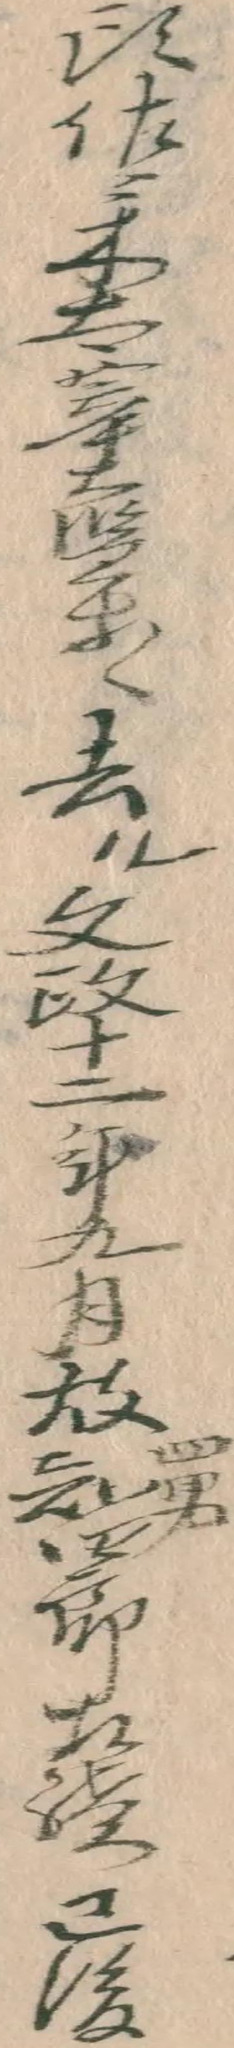頭佐々木太宰大監へ去ル文政十二年九月四男知四郎相續已後
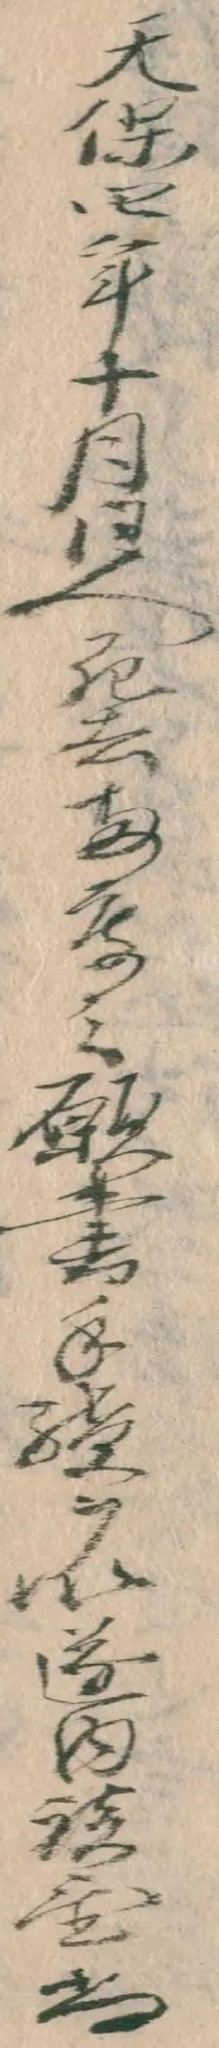天保四年十月同人死去両存之願書手續ヲ以遂内談置尚
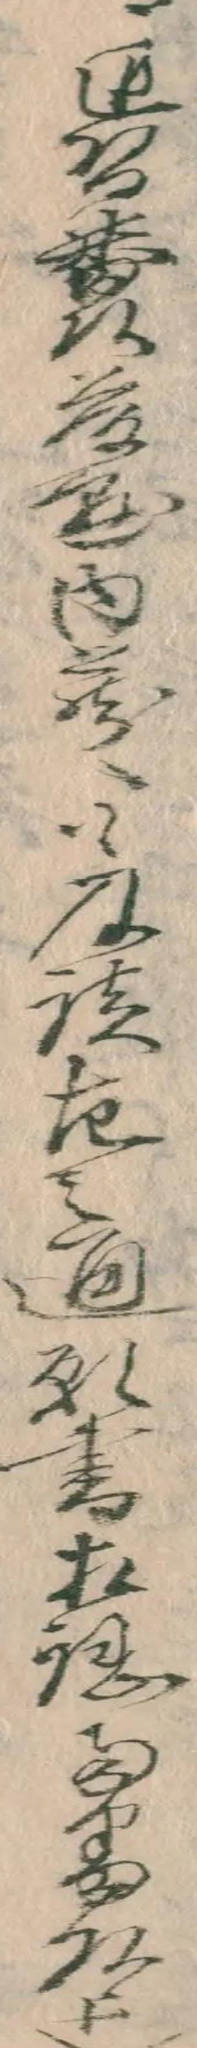御近習番頭藤野内蔵へも及談左之通願書相認両番頭迄
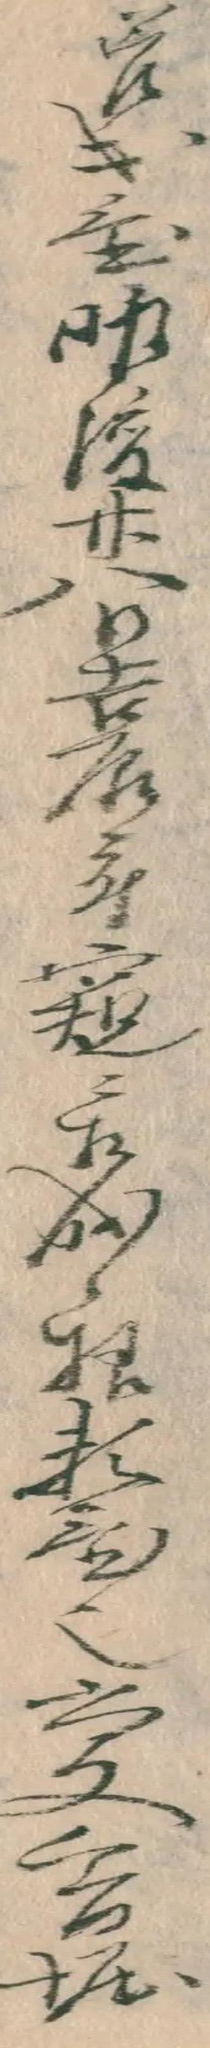差出置明後廿八日吉辰ニ付窺ニ相成候様相置也尚又今日堀
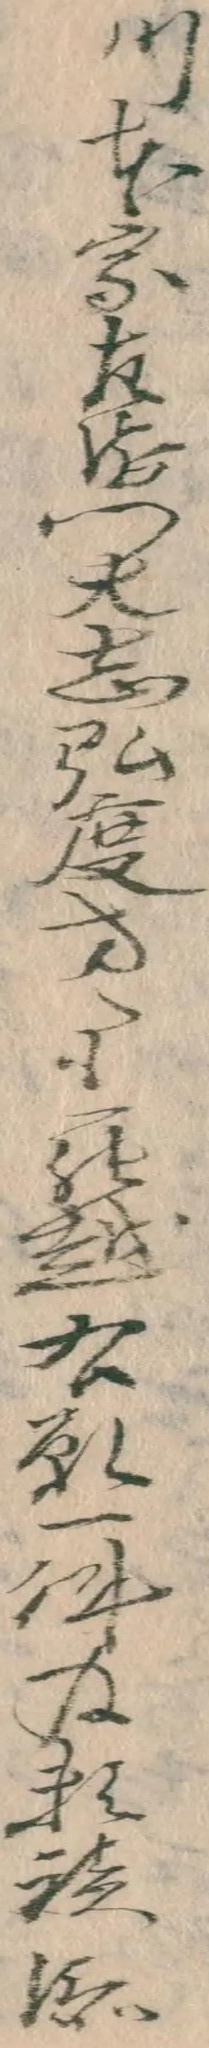川本家左衛門大志弘度方へも罷越右願一件及頼談添
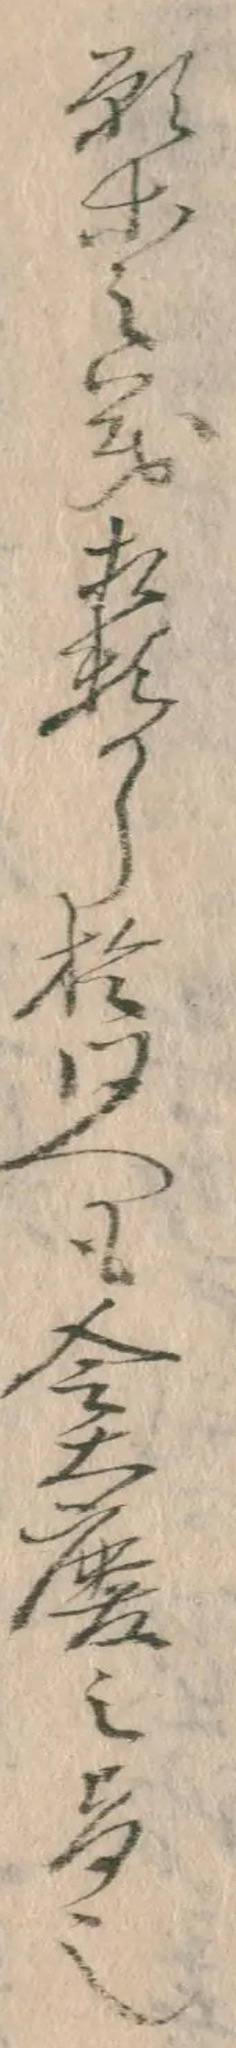願等之義相頼了於同人も令大慶之旨也
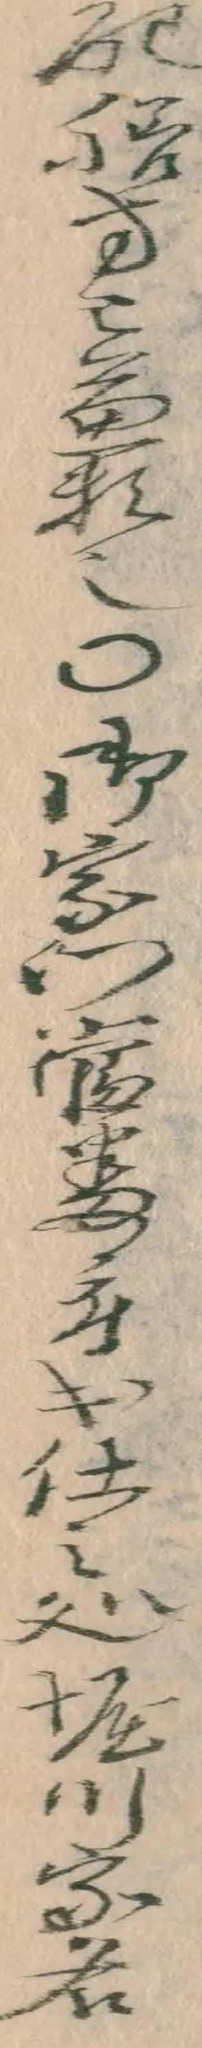配膳方被兼頼也〇御家門當番ニ付出仕之処堀川家名
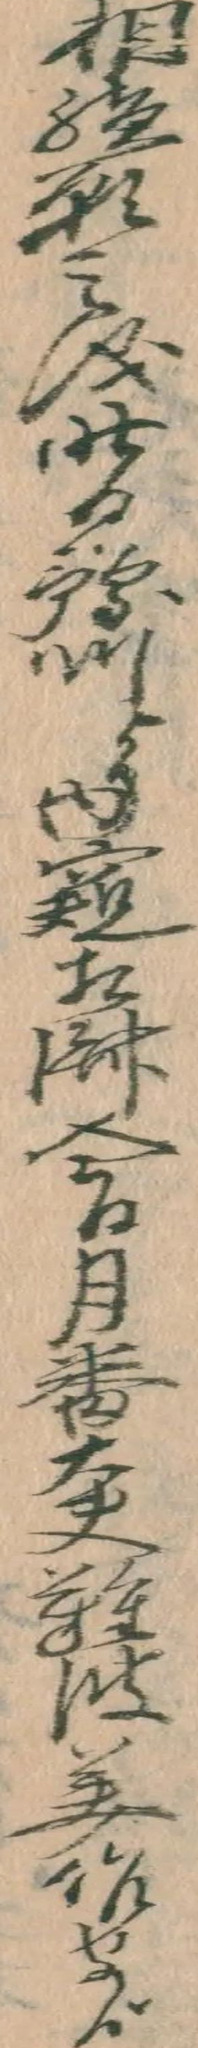相續願之儀昨日豫州より内窺相済今日月番大夫難波美作守ゟ
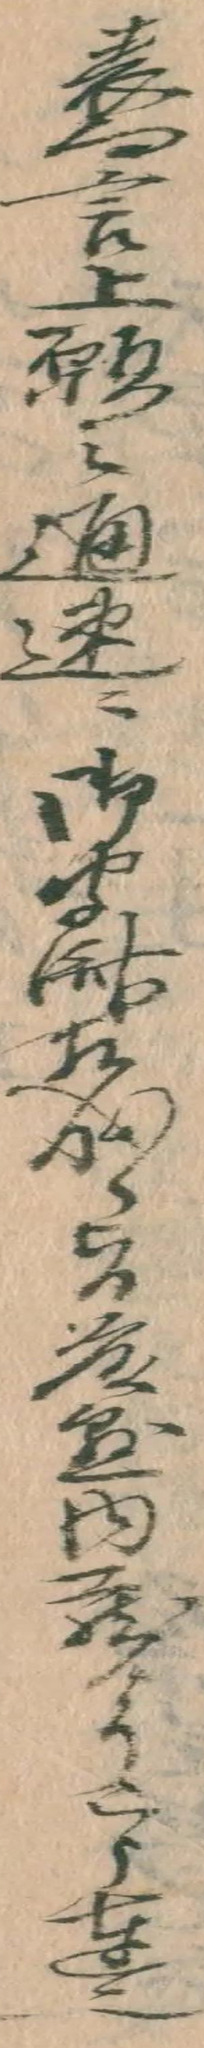表向言上願之通速二御聞済相成候旨藤野内蔵より被申達也
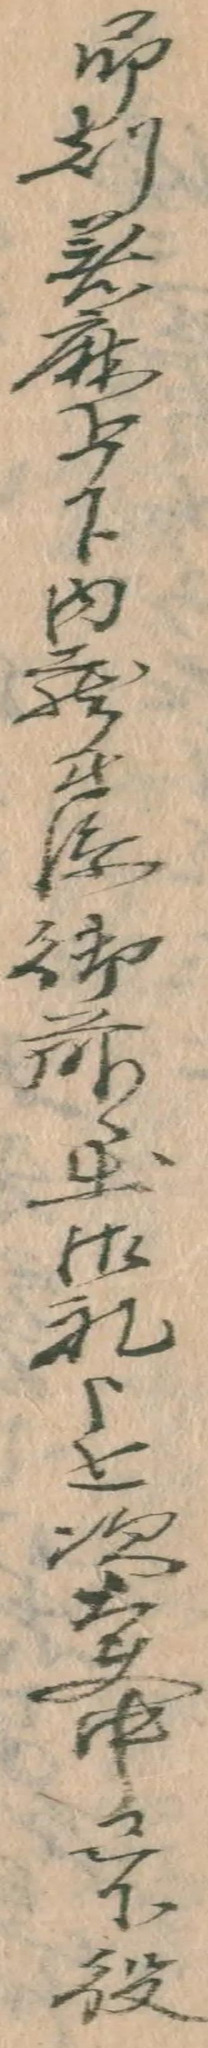即刻着麻上下内蔵付添御前へ出御礼申上次大夫申已下役
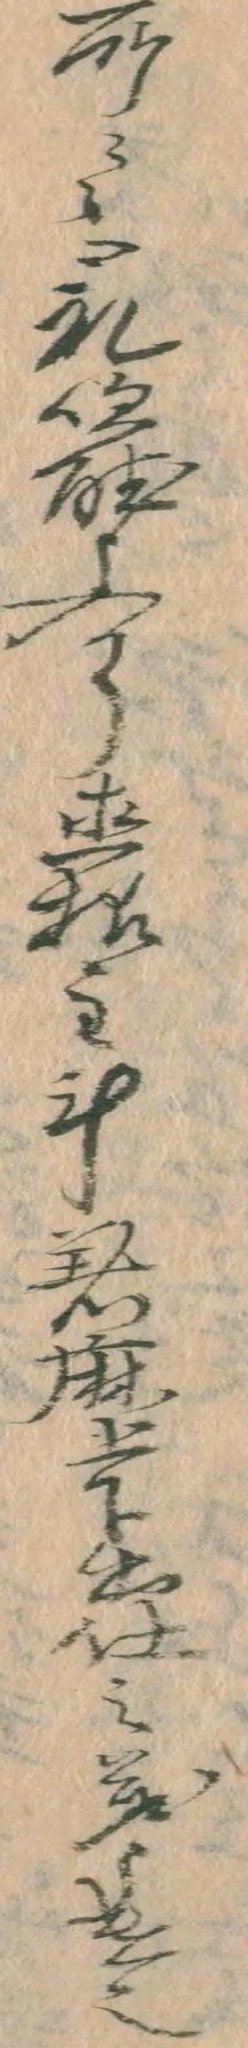所々々御礼吹聴申入了直招主斗着麻上下出仕之義申遣也
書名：賀茂社記録. 第69冊
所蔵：国立国会図書館 National Diet Library, JAPAN
